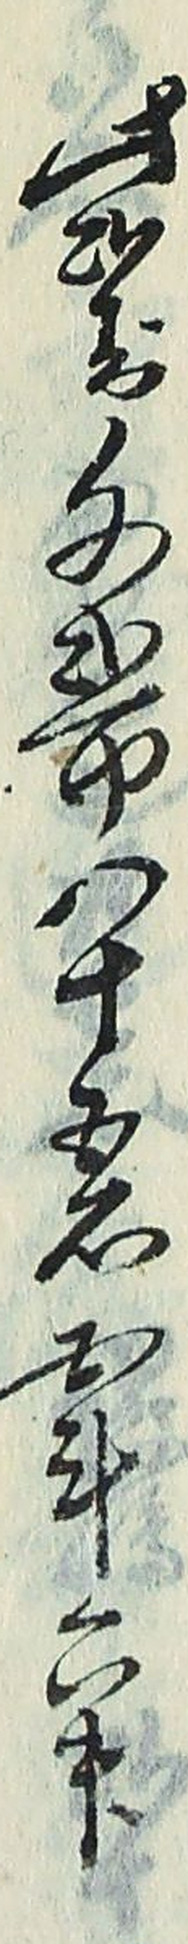此弐歩千弐百八十五石五斗六升
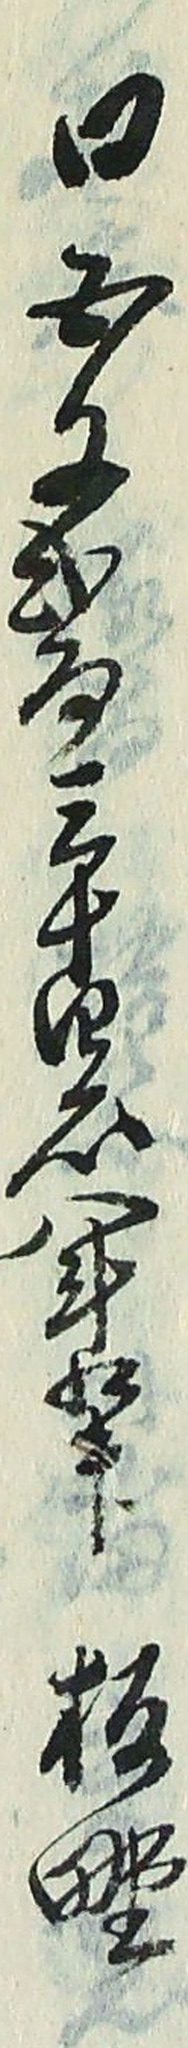同五千弐百三十四石八斗九升板野
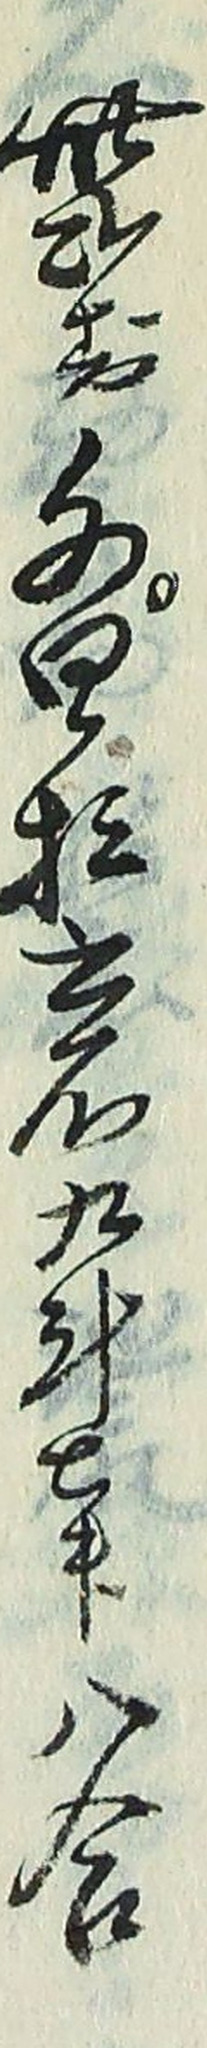此弐歩千四拾六石九斗七升八合
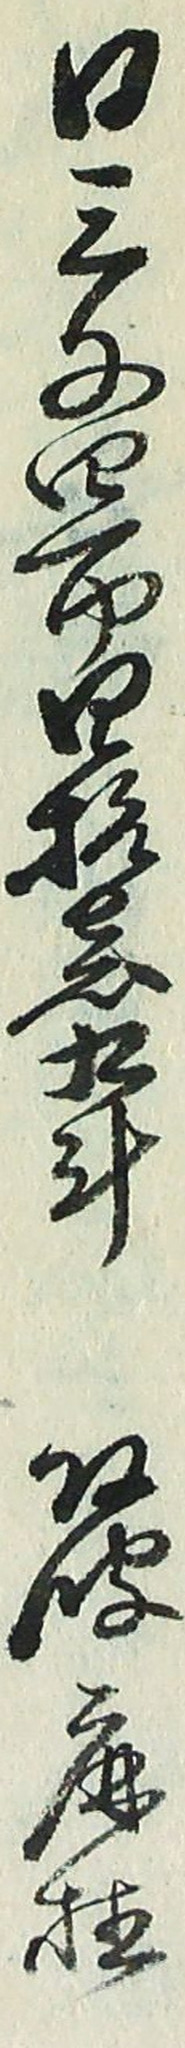同三千四百四拾七石九斗阿波麻植
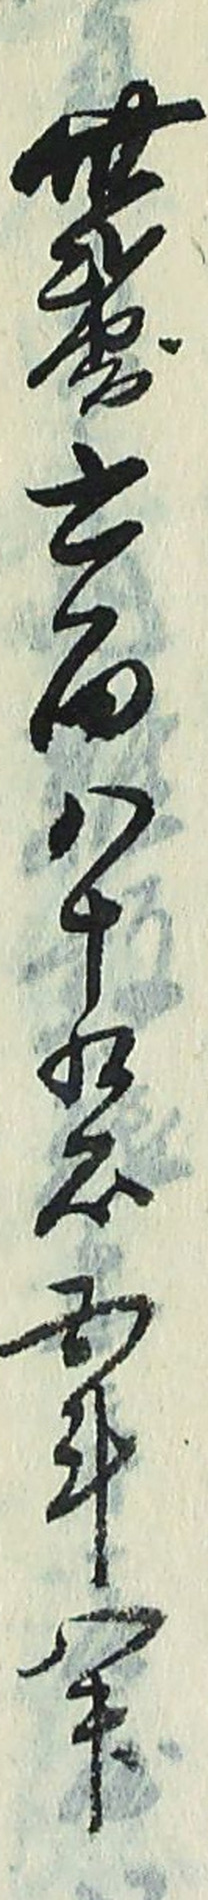此弐歩六百八十九石五斗八升
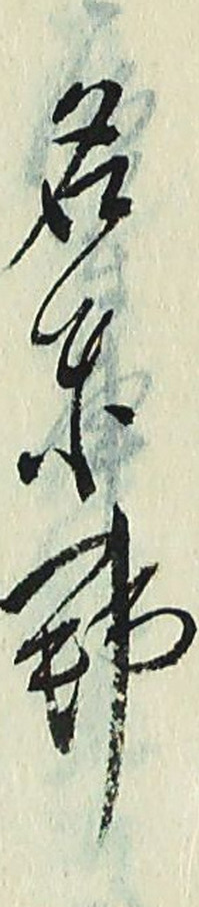名東郡
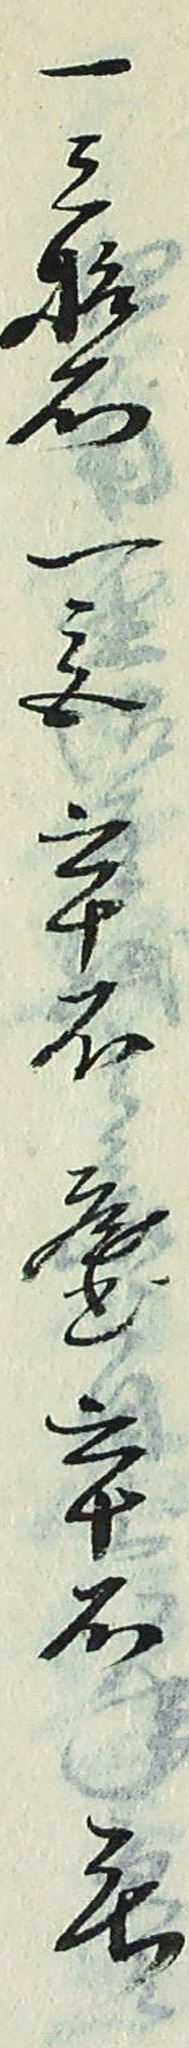一三拾石一宮六十石蔵本六十石庄
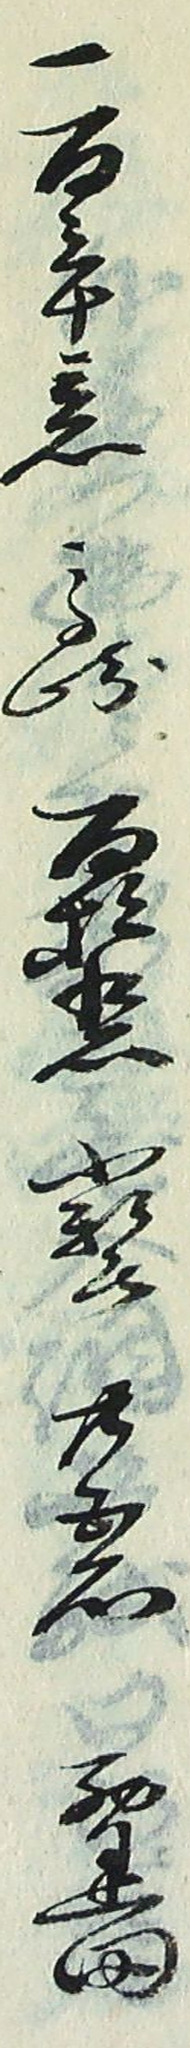一百三十三石高崎百拾九石北新居廿五石西黒田
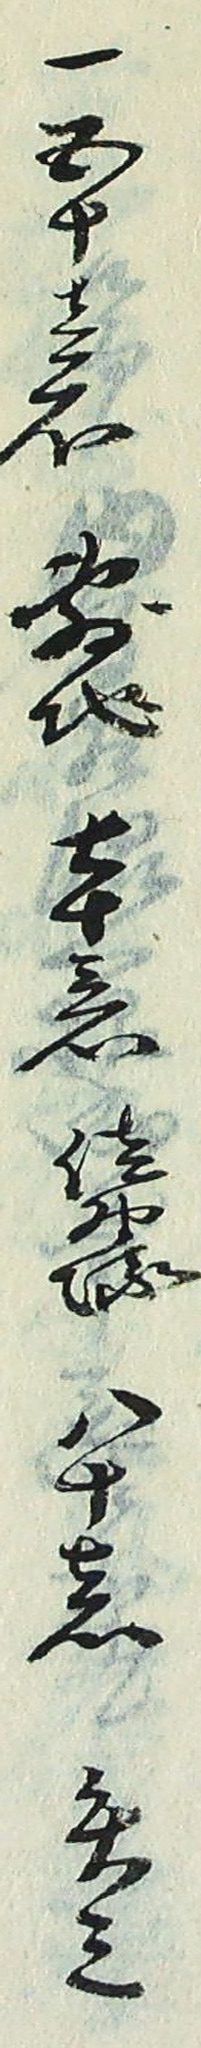一五十壱石敷地七十三石佐野塚八十七石矢三
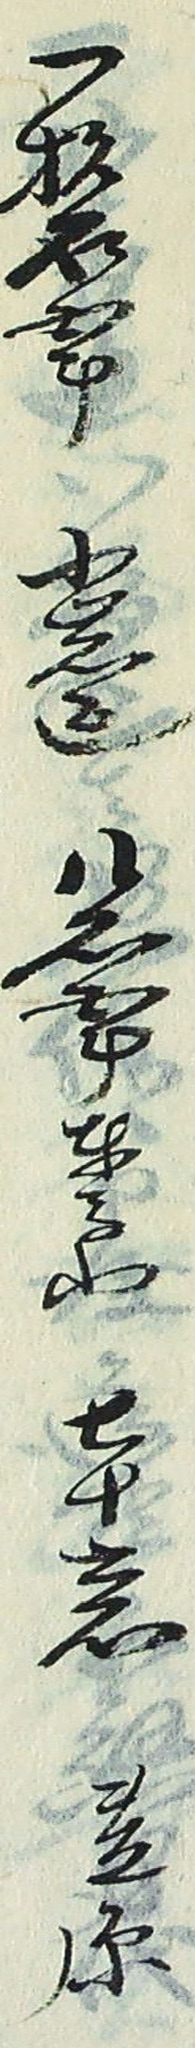一拾石五斗北岩延八石五斗東高輪七十六石芝原
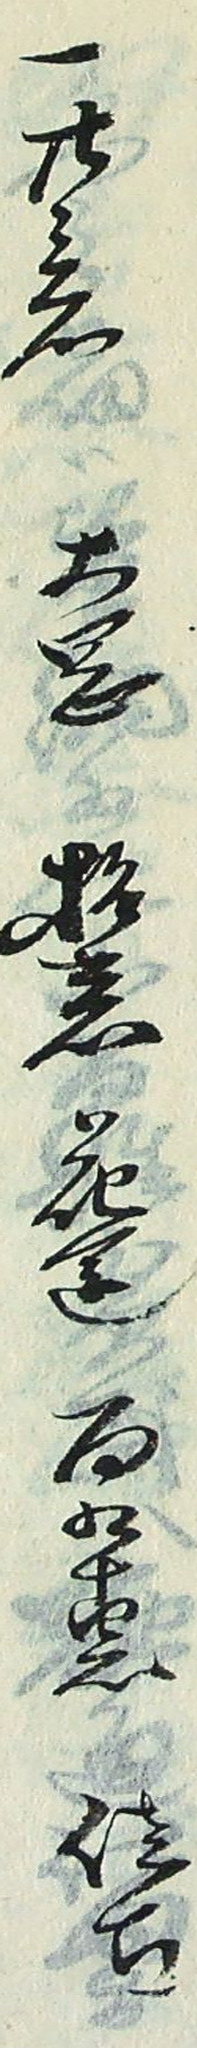一廿三石大岡拾六石花園百九十四石佐古
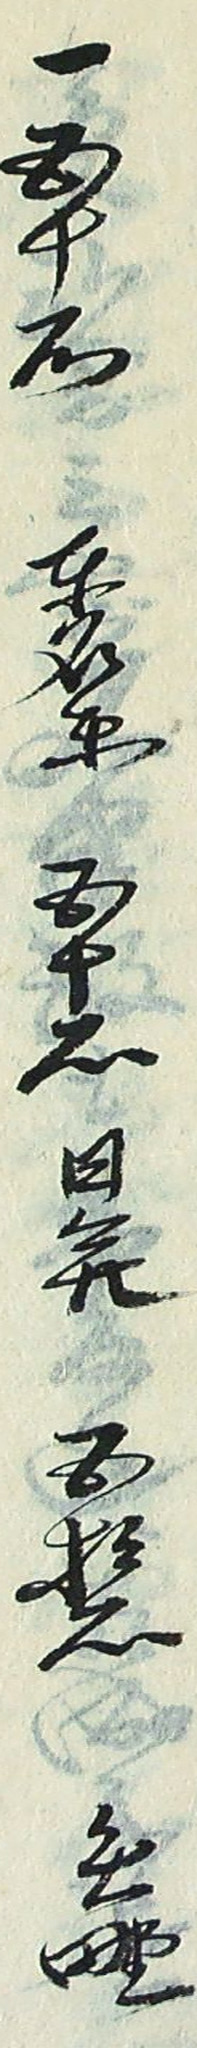一五十石東名東五十石日開五拾石矢野
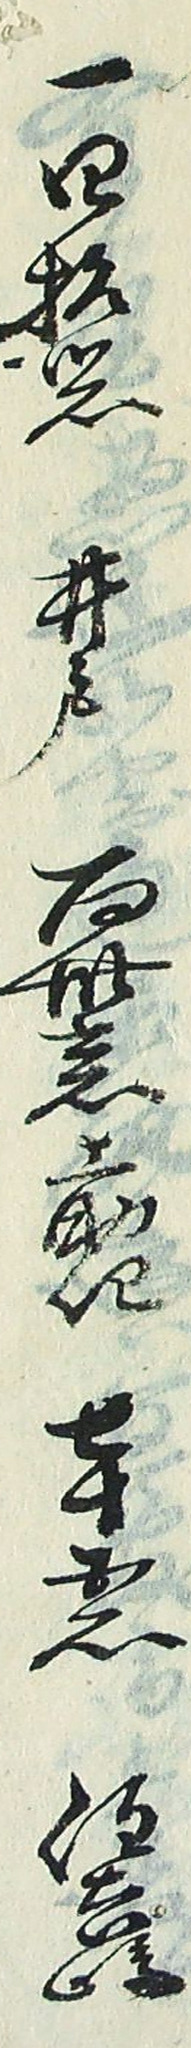一四拾弐石井戸百三十六石上助任七十五石住吉嶋

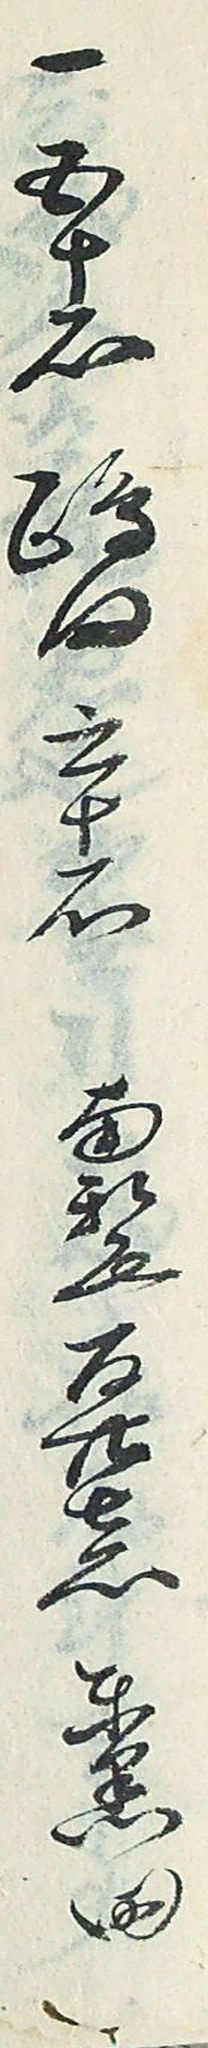一五十石嶋田六十石南新居百廿七石東黒田
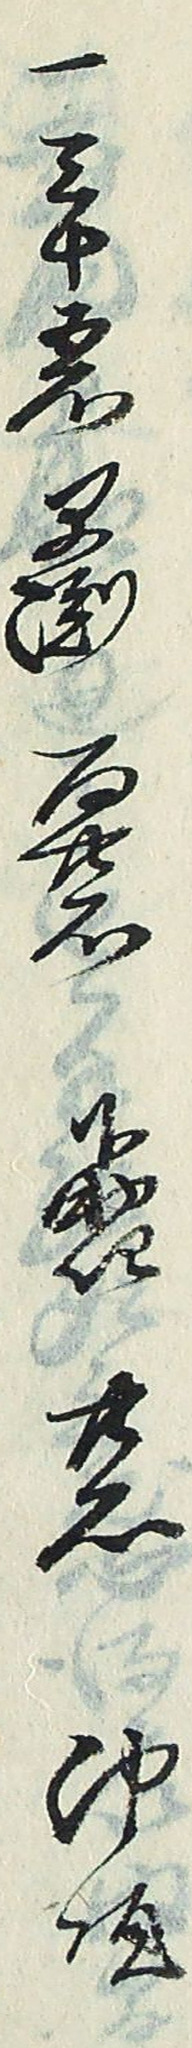一三十五石早渕百廿石下助任廿石沖須
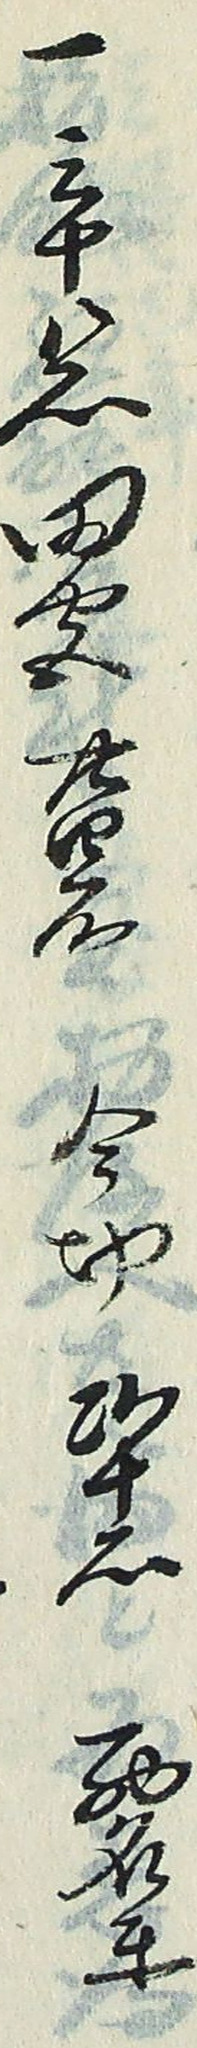一三十八石田宮廿四石今切弐十石西名東
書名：諸御趣意書并御下知向之写
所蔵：鳴門教育大学 Naruto University of Education
